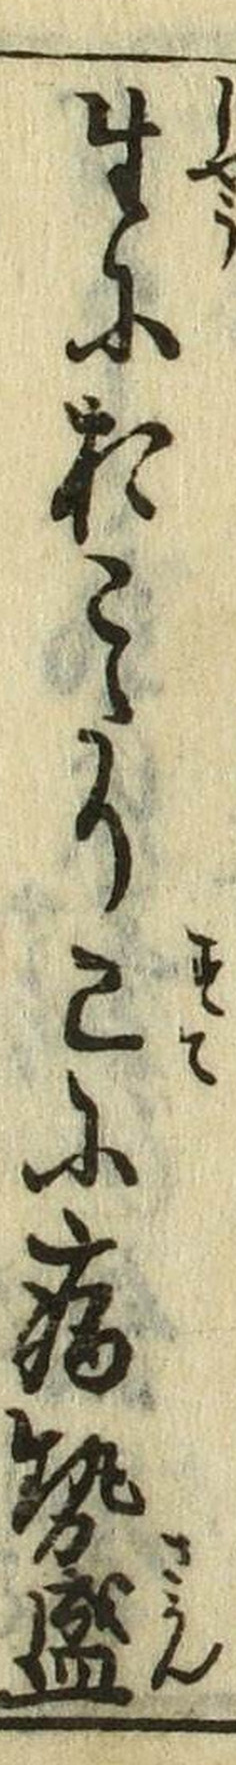生におこたり已に病勢盛
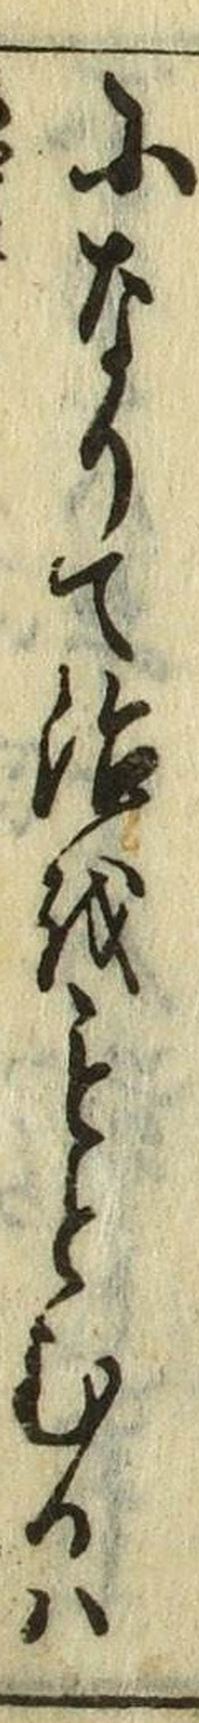になりて治をもとむるは
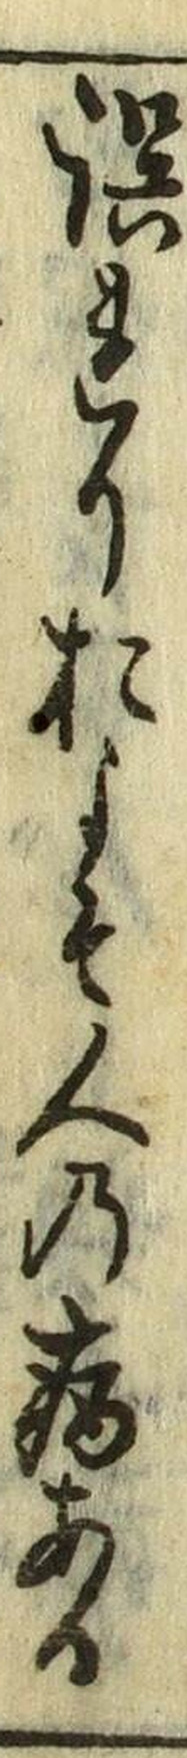誤れりおよそ人の病ある
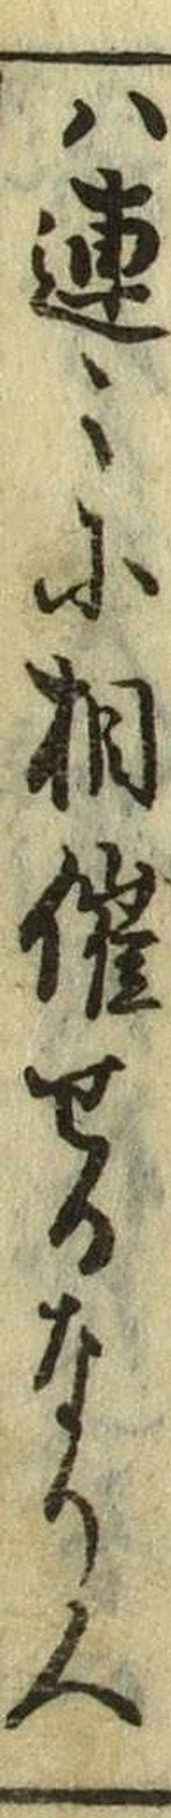は連々に相催せるなり人

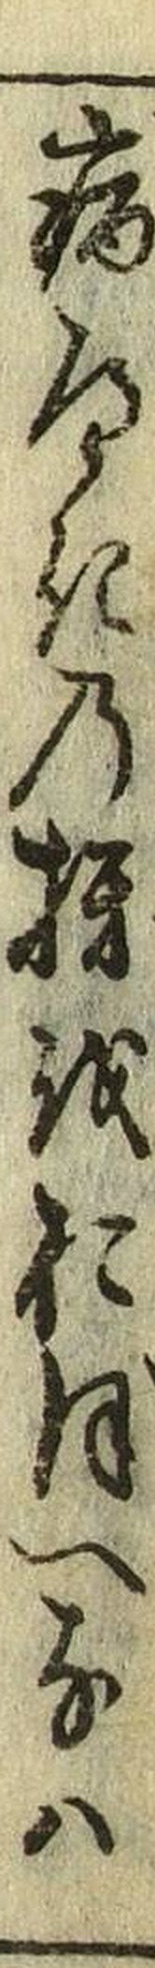病べきの機をおぼへなは
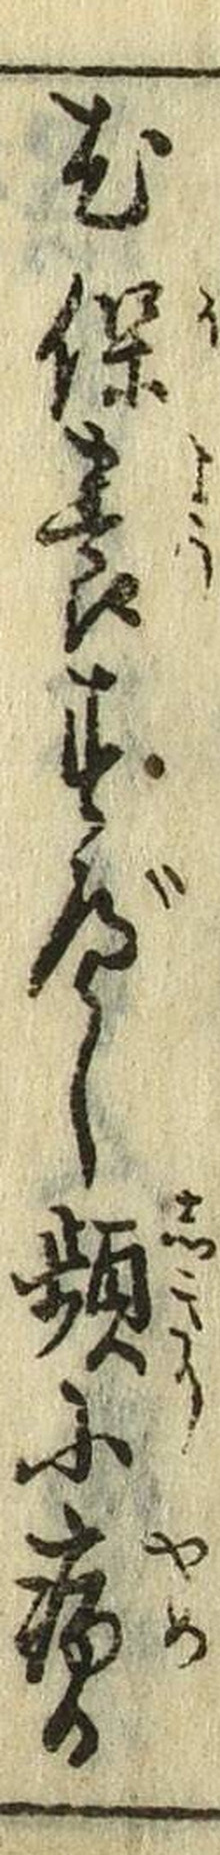尤保養すべし頻に病る
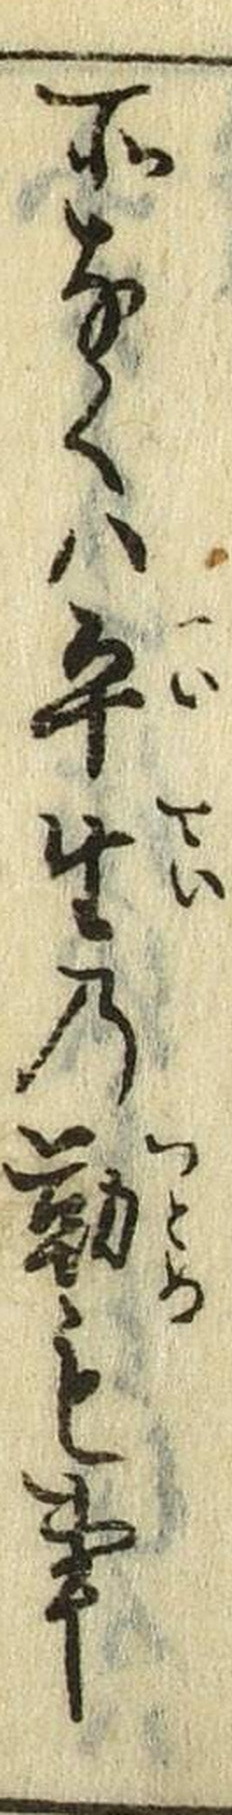所なくは平生の勤も事
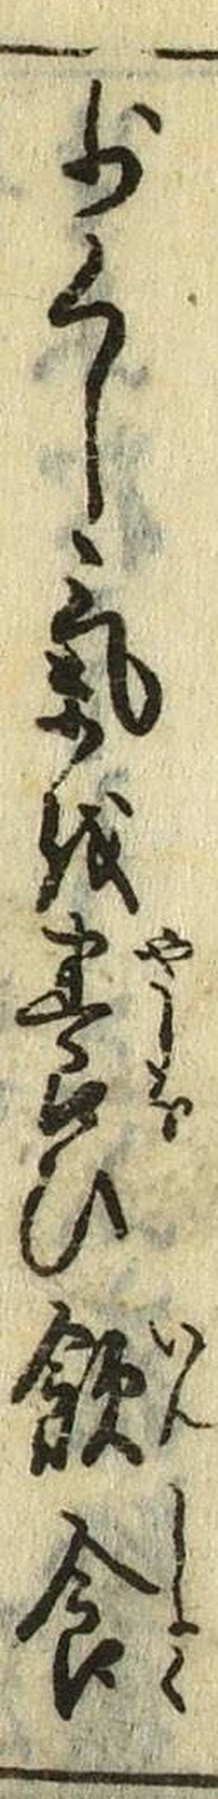少くし気を養ひ飲食
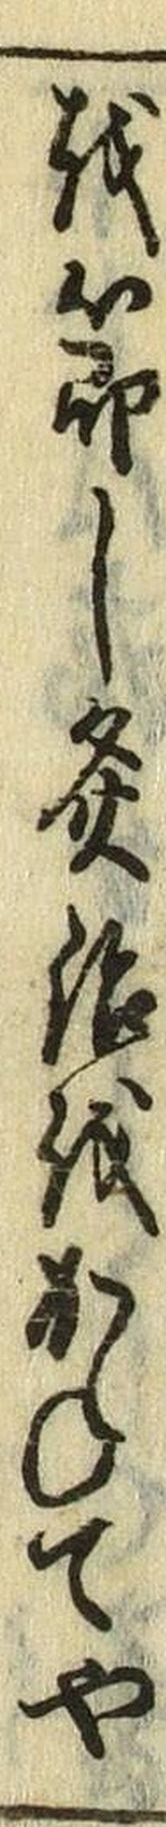を節し灸治をかねてや
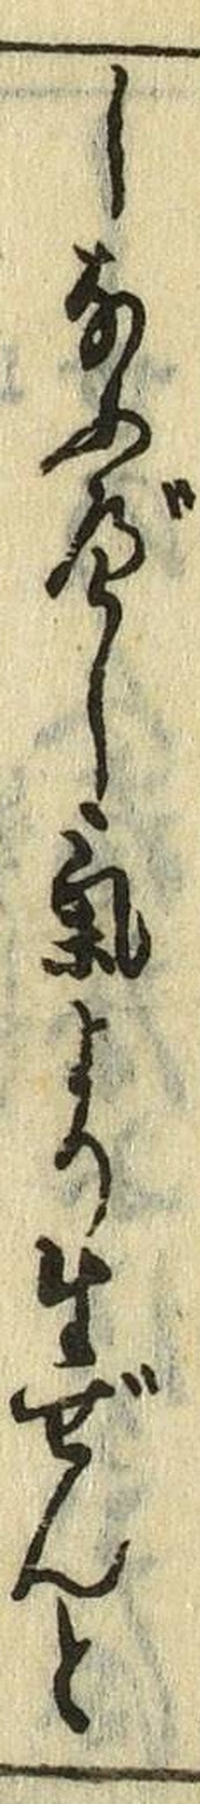しなふべし気より生ぜんと
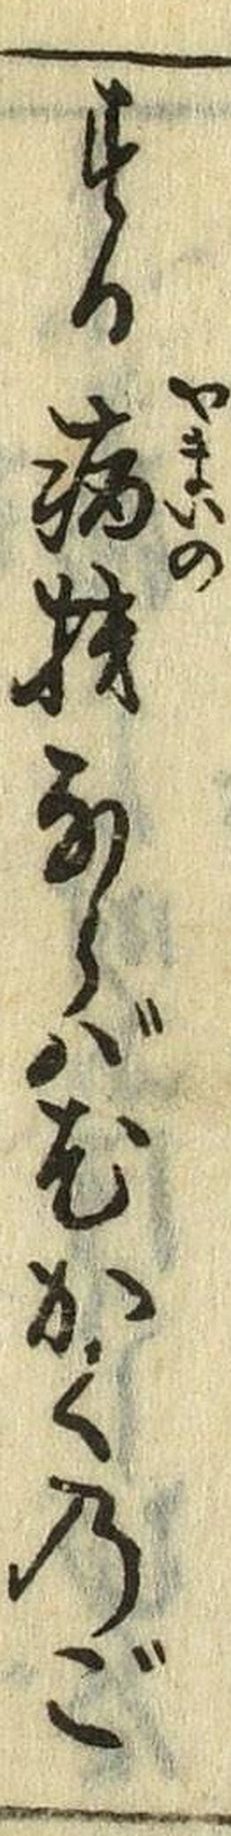する病機ならば尤かくのご
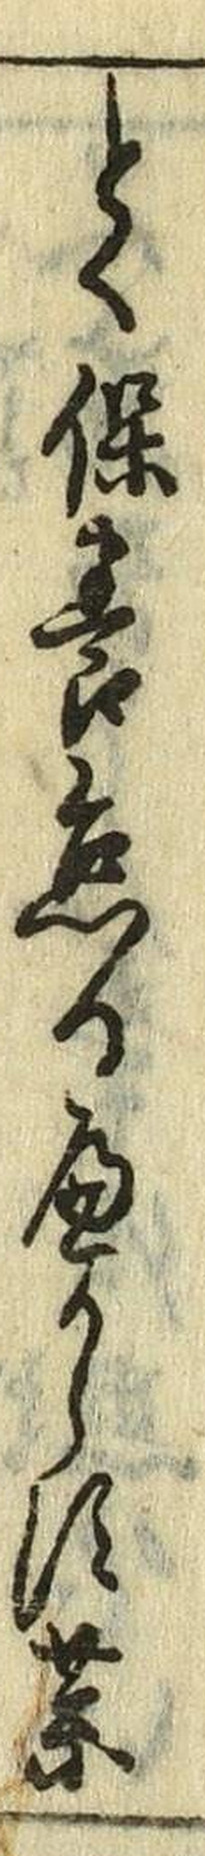とく保養怠るへからす薬
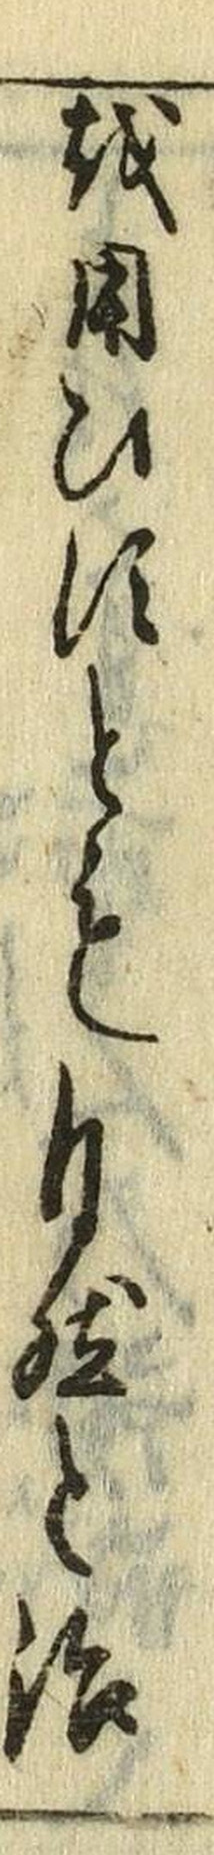を用ひすとも自然と治
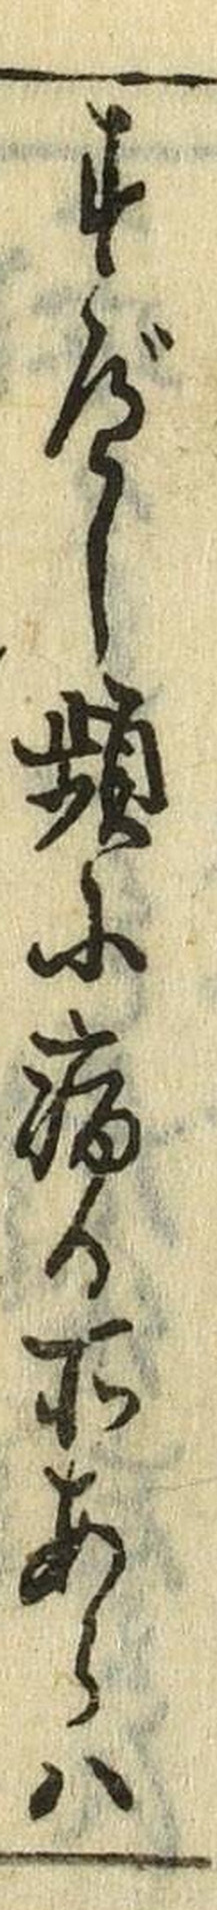すべし頻に病る所あらは
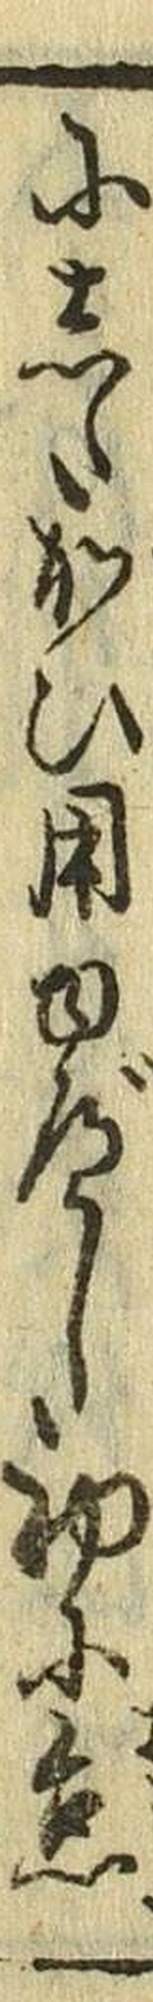にしたがひ用ゆべし初に怠
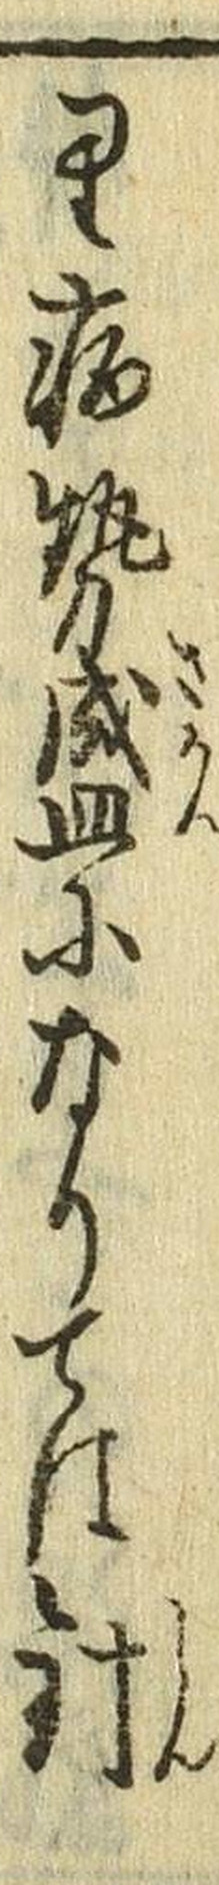り病勢盛になりては針
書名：居家養生記
